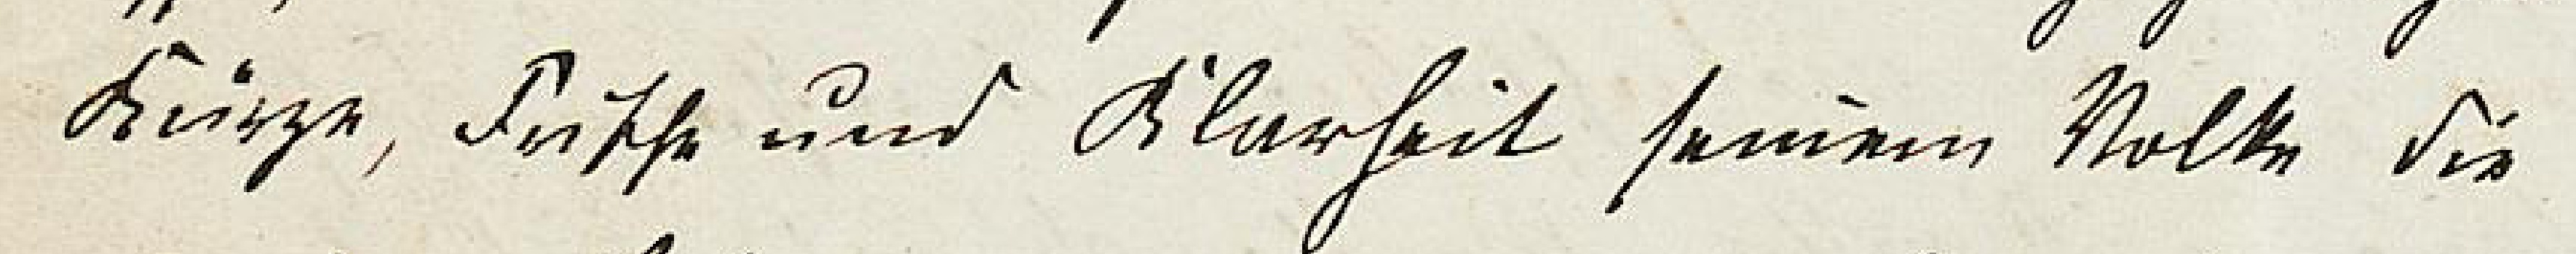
Kürze, Frische und Klarheit seinem Volk die
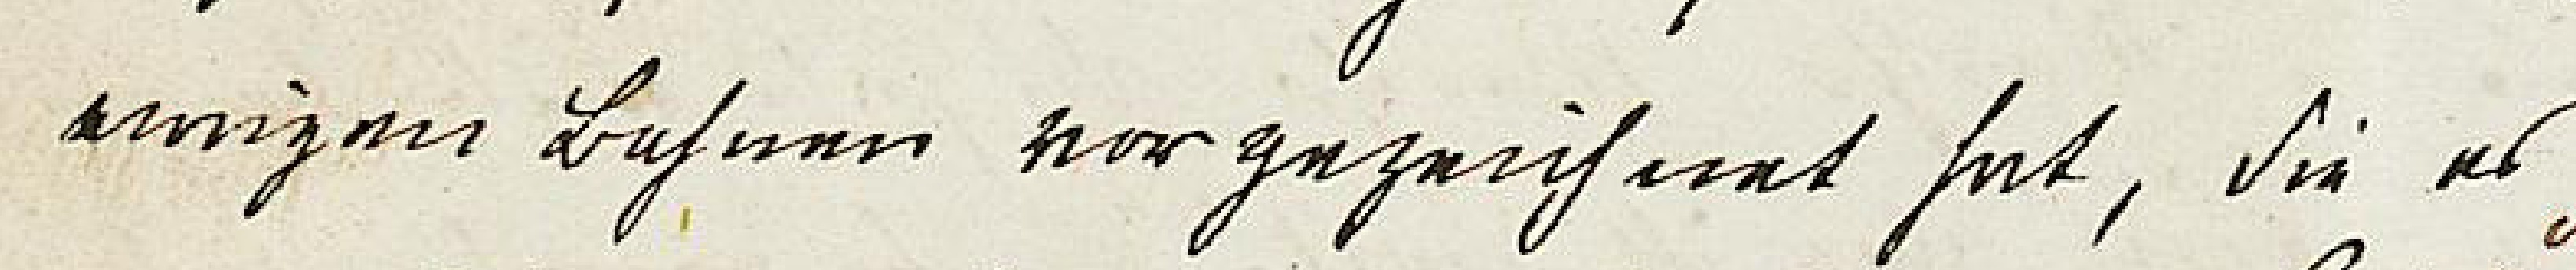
ewigen Bahnen vorgezeichnet hat, die es
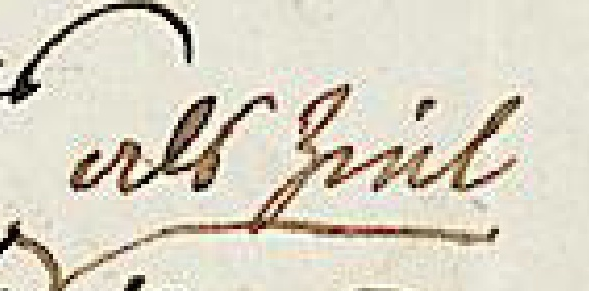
als Ziel
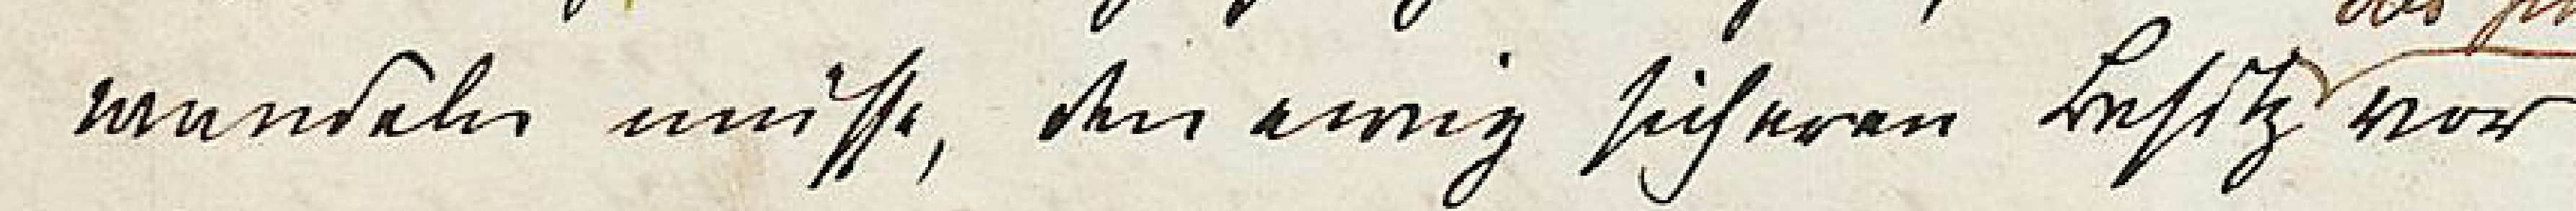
wandeln müsse, den ewig sicheren Besitz vor
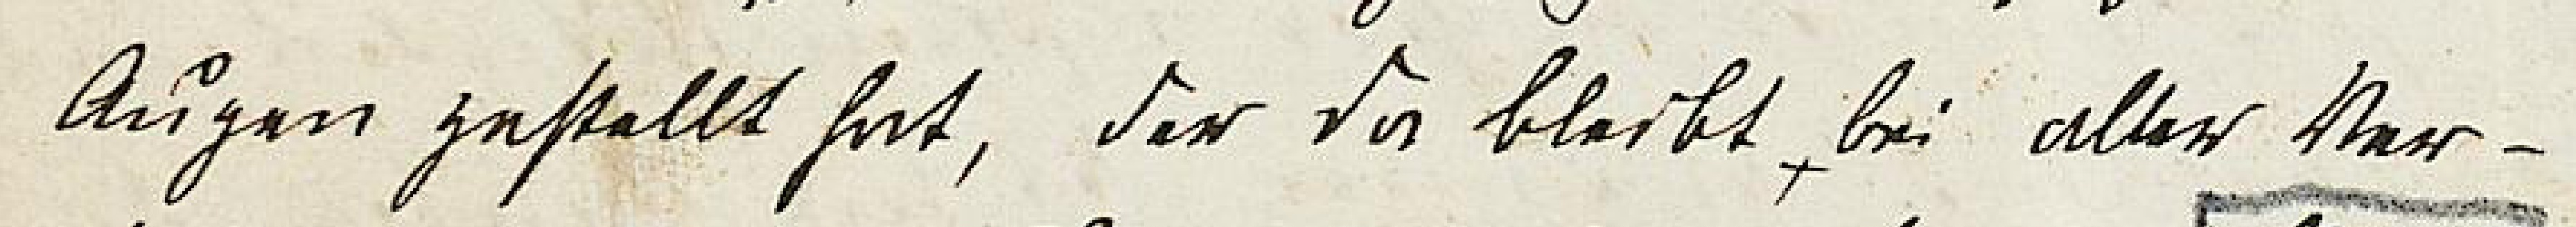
Augen gestellt hat, der da bleibt, bei aller Ver¬
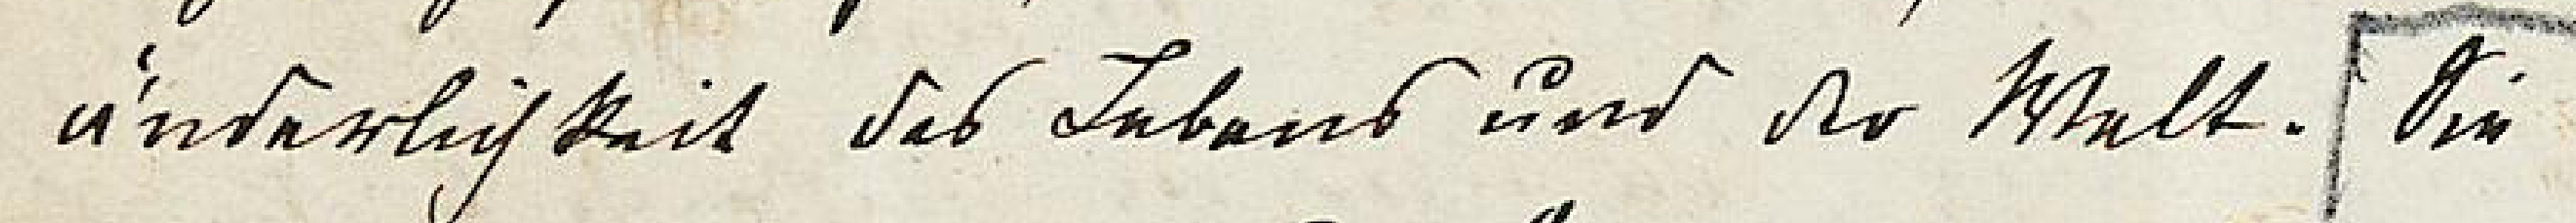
änderlichkeit des Lebens und der Welt. | Sie
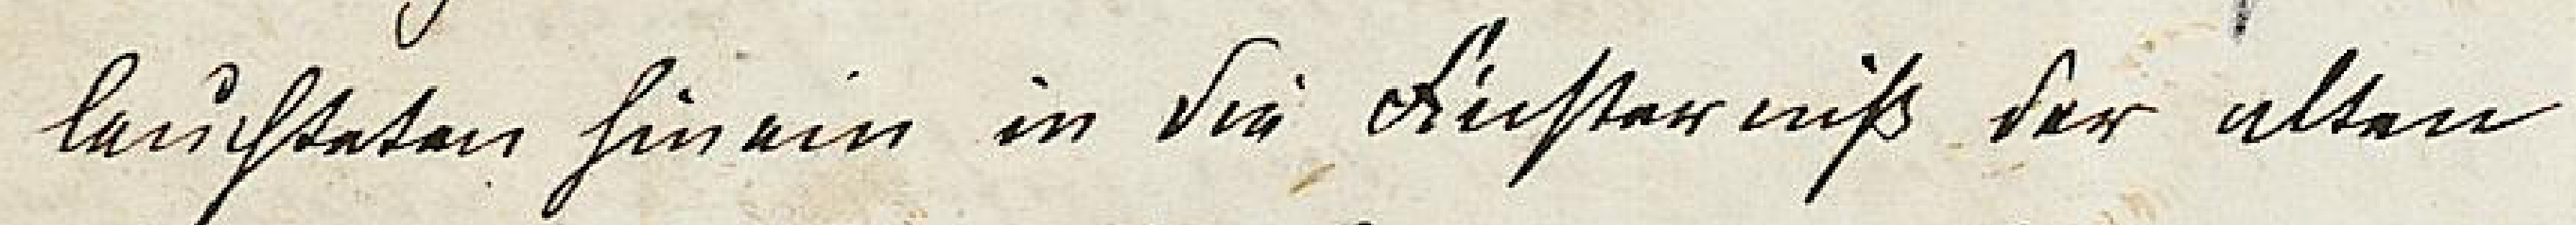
leuchteten hinein in die Finsterniß der alten
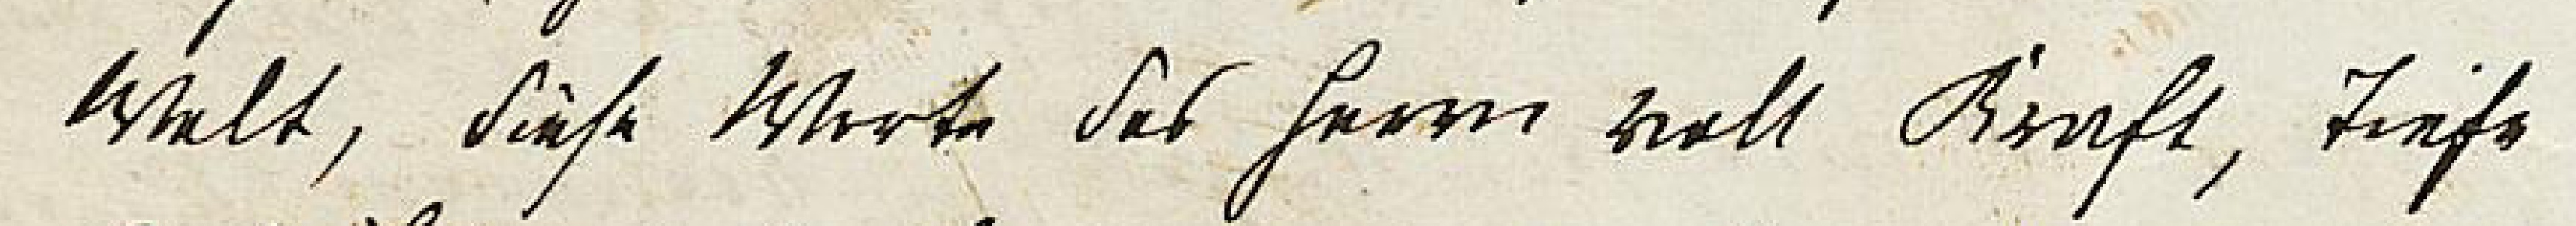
Welte, dies Worte des Herrn voll Kraft, Tiefe
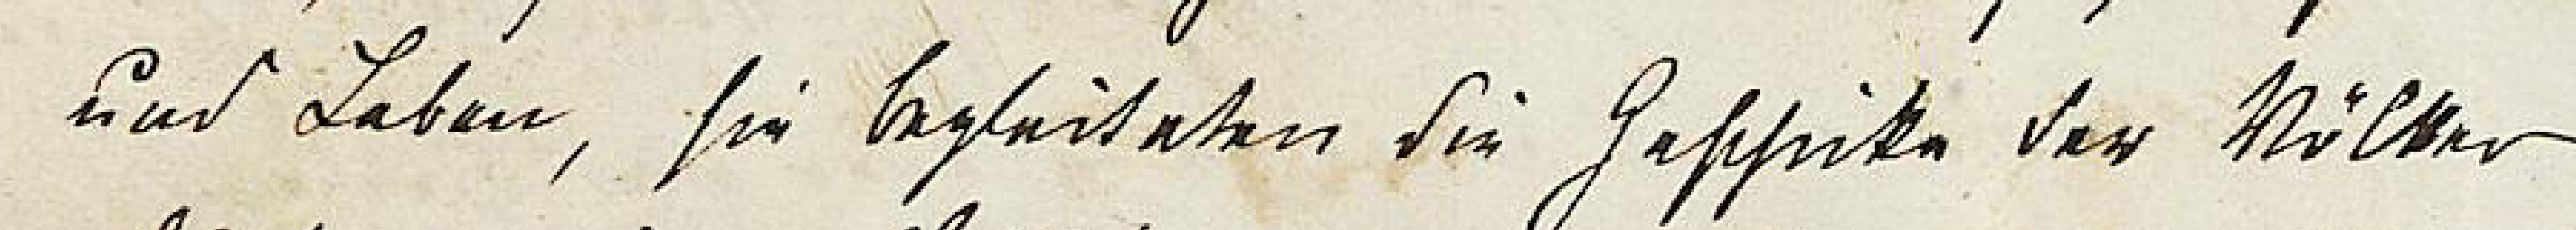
und Leben, sie begleiteten die Geschicke der Völer
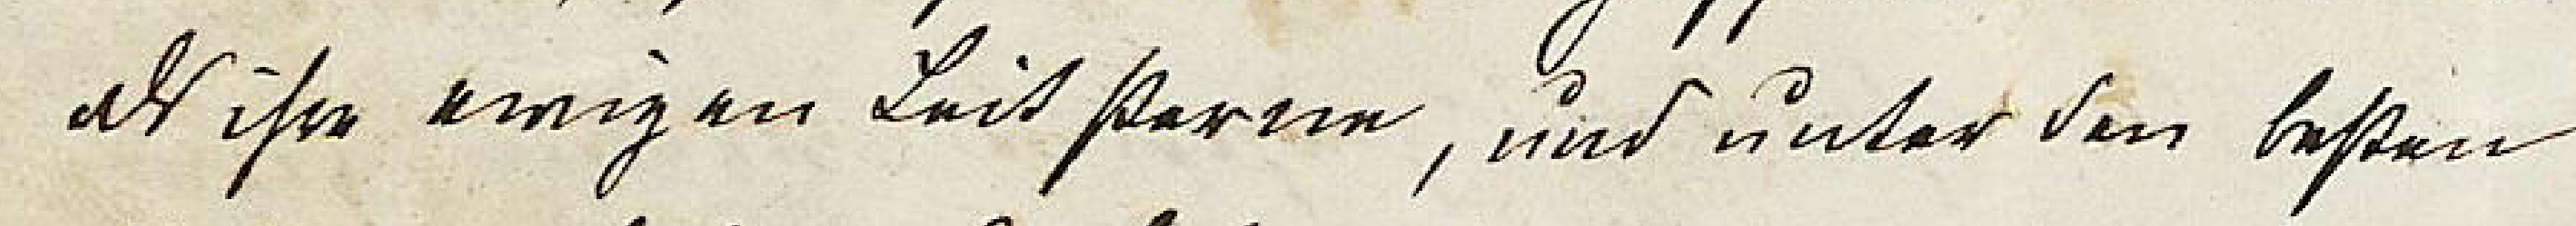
als ihre ewigen Leitsterne, und unter den besten
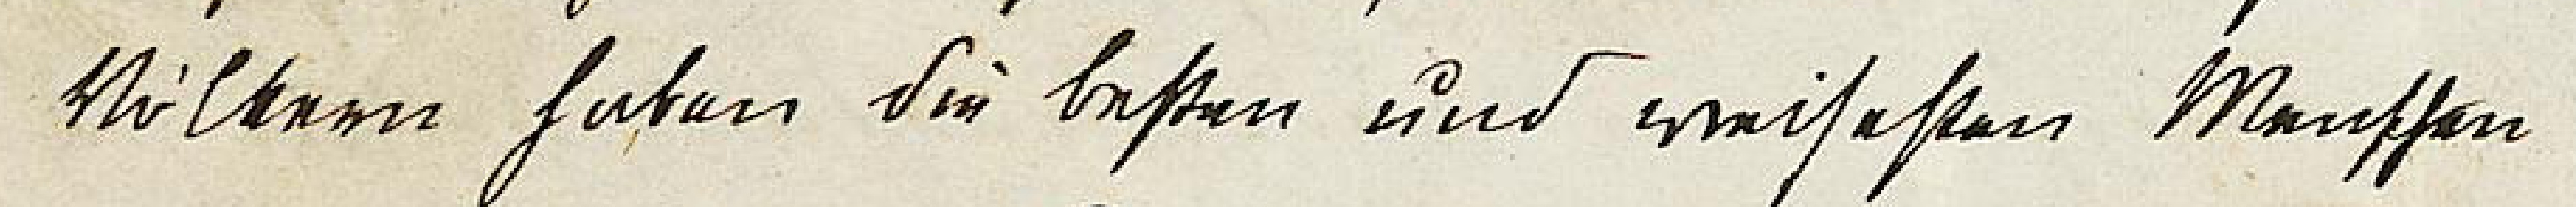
Völkern haben die besten und weisesten Menschen
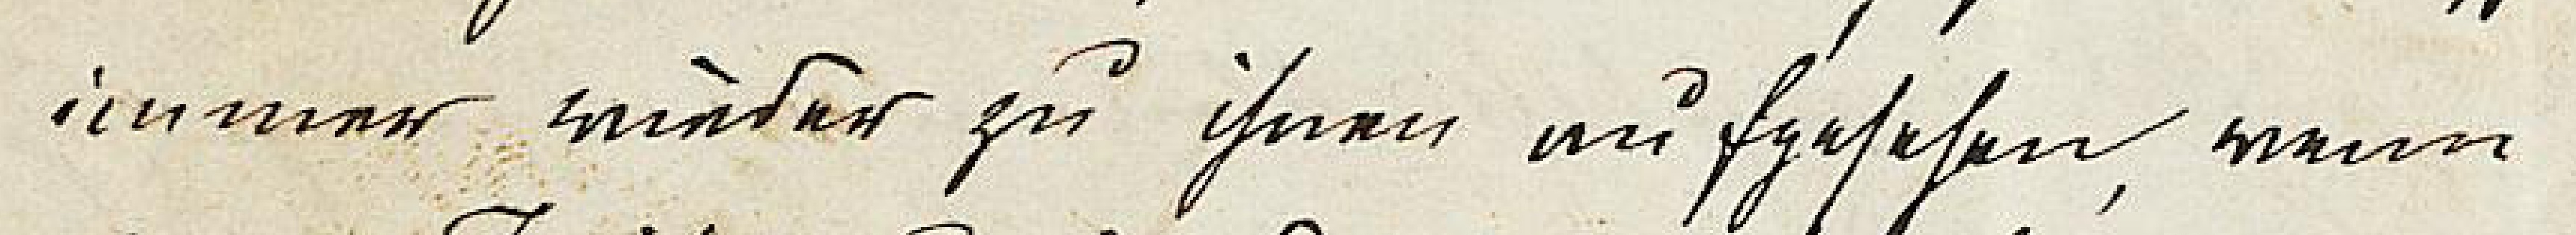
immer wieder zu ihnen aufgesehen, wenn
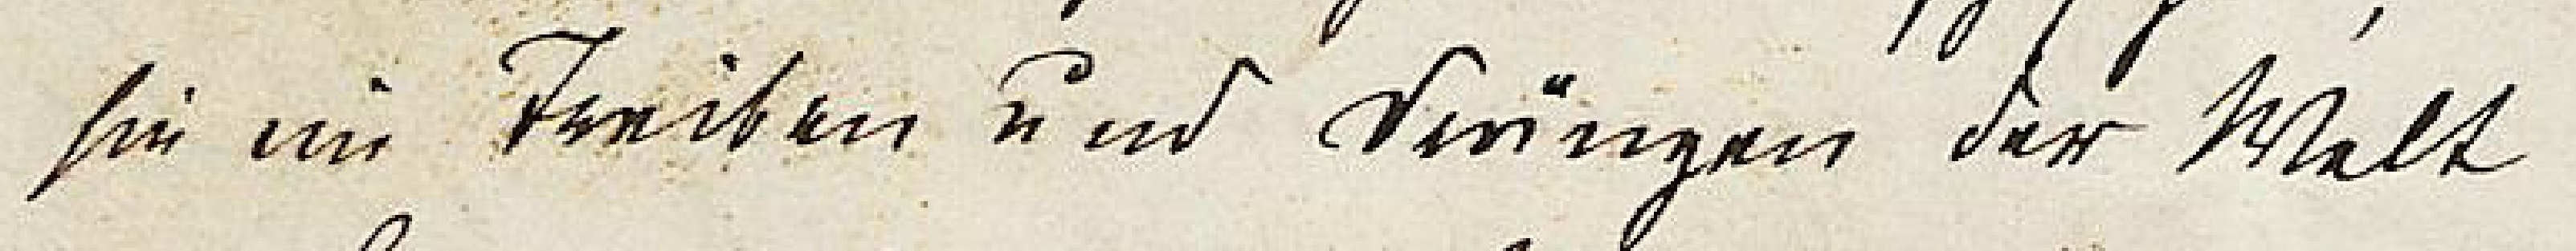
sie im Treiben und Drängen der Welt
